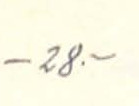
28.
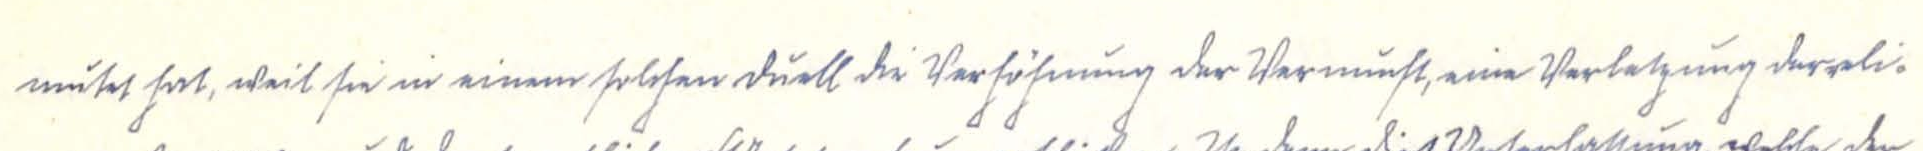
mutet hat, weil sie in einem solchen Duell die Verhöhnung der Vernunft, eine Verletzung derreli-
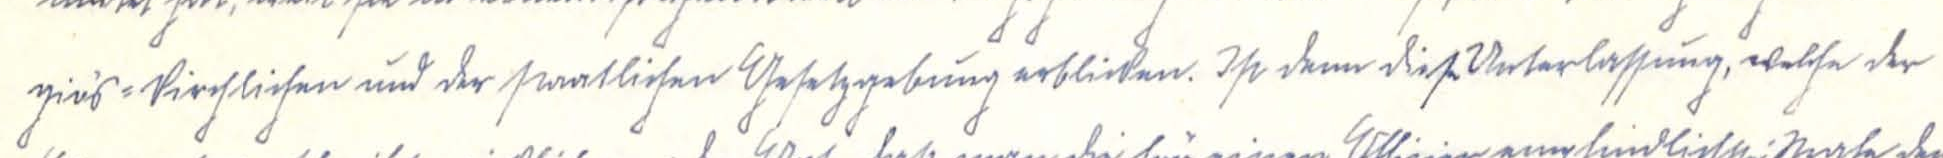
giös - kirchlichen und der staatlichen Gesetzgebung erblicken. Ist denn diese Unterlassung, welche der
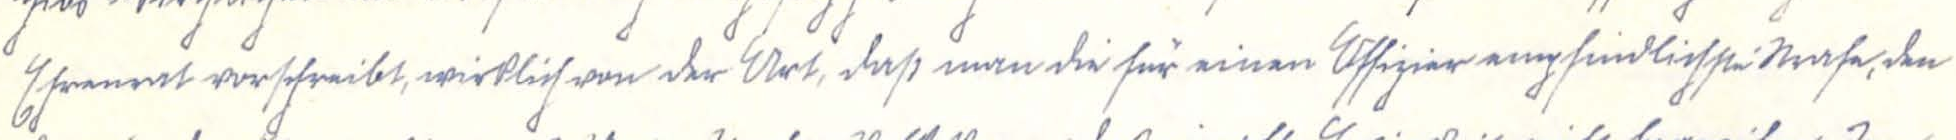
Ehrenrat vorschreibt, wirklich von der Art, daß man die für einen Offizier empfindlichste Strafe, den
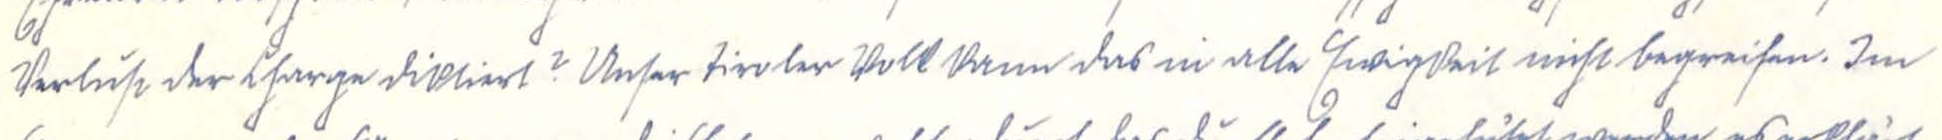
Verlust der Charge diktiert? Unser Tiroler Volk kann das in alle Ewigkeit nicht begreifen. Im
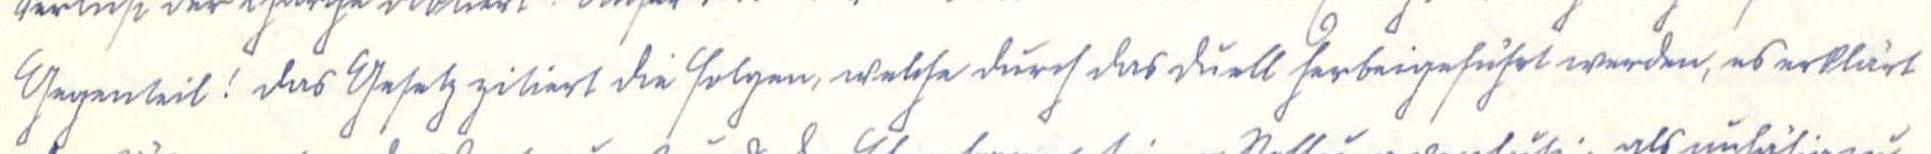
Gegenteil! Das Gesetz zitiert die Folgen, welche durch das Duell herbeigeführt werden, es erklärt
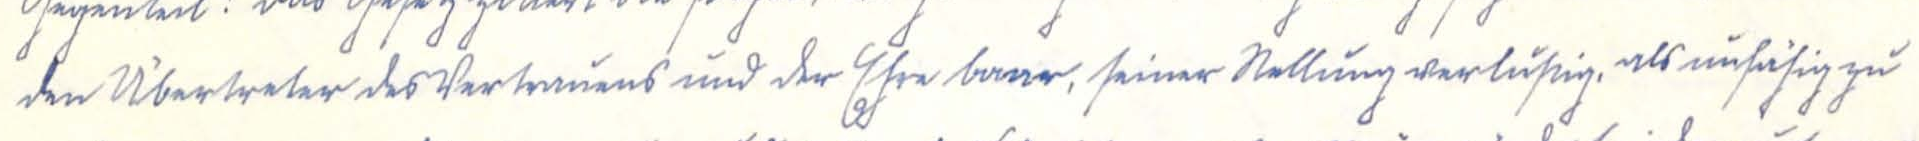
den Übertreter des Vertrauens und der Ehre bare, seiner Stellung verlustig, als unfähig zu
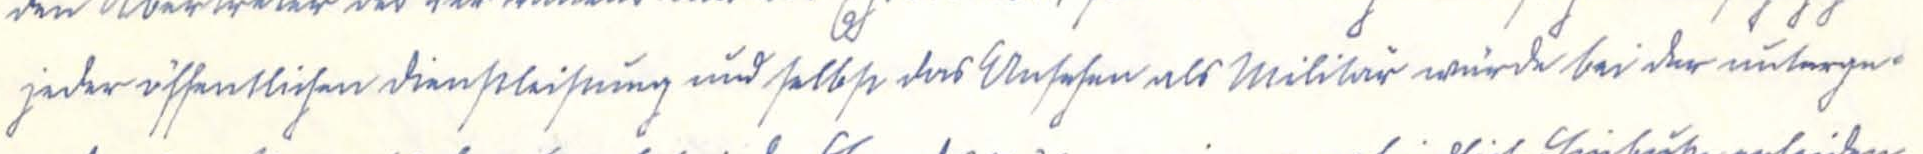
jeder öffentlichen Dienstleistung und selbst das Ansehen als Militär würde bei der unterge-
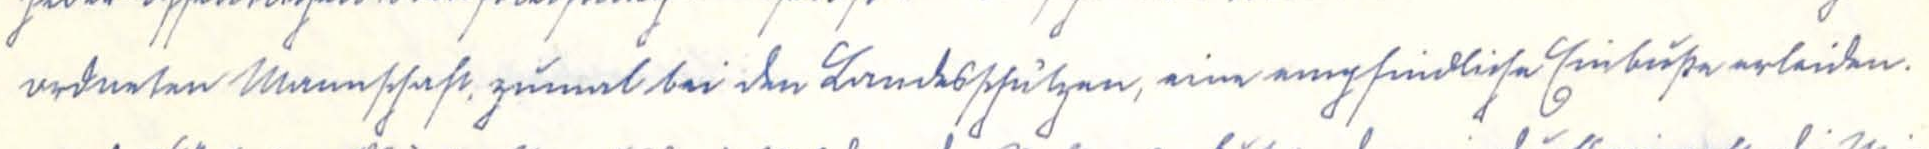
ordeten Mannschaft zumal bei den Landesschützen, eine empfindliche Einbuße erleiden.
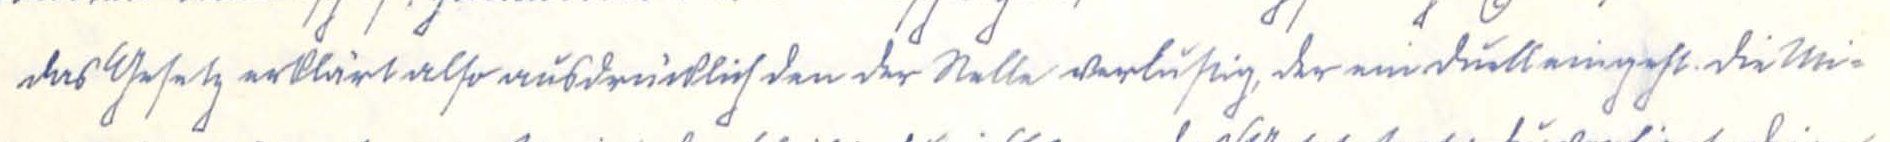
Das Gesetz erklärt also ausdrücklich den der Stelle verlustig, der ein Duell eingeht. Die Mi-
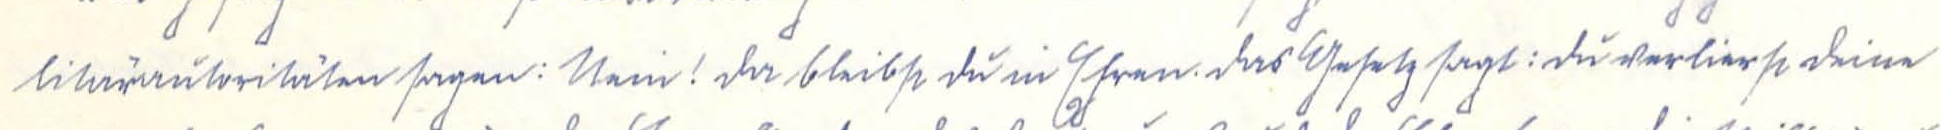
litärautoritäten sagen: Nein! Da bleibst du in Ehren. Das Gesetz sagt: Du verlierst deine
